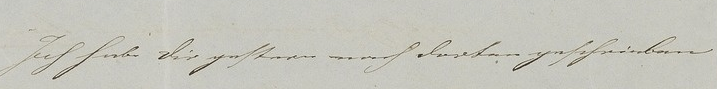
Ich habe dir gestern nach dorten geschrieben
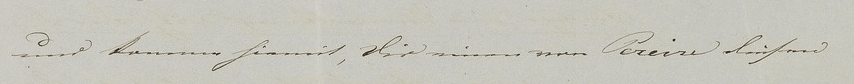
und komme hiemit, dir einen von Pereire diesen
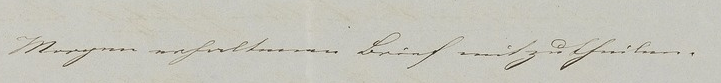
Morgen erhaltenen Brief mitzutheilen.
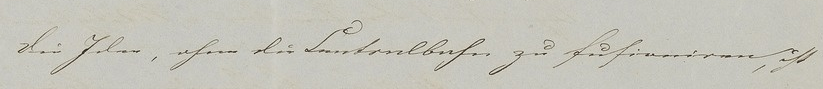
Die Idee, ohne die Centralbahn zu fusioniren, ist
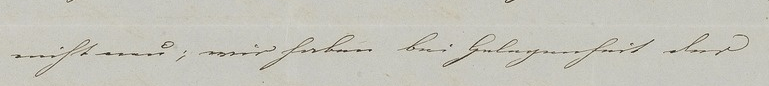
nicht neu; wir haben bei Gelegenheit der
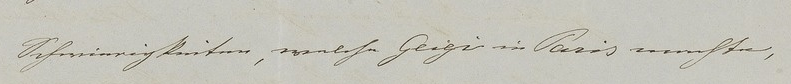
Schwierigkeiten, welche Geigi in Paris machte,
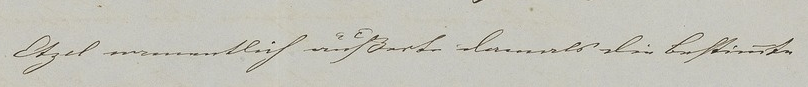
Etzel namentlich äußerte damals die bestimmte
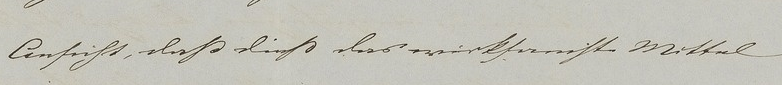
Ansicht, daß dieß das wirksamste Mittel
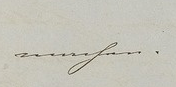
machen.
